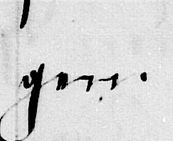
gen.
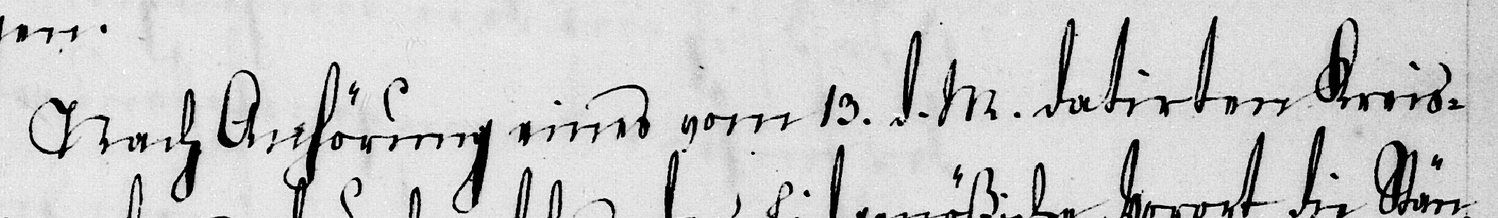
Nach Anhörung eines vom 13. d. M. datirten Kreis¬
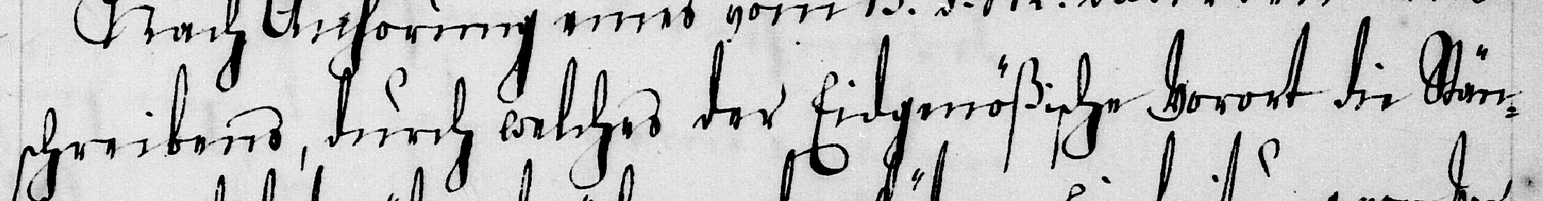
schreibens, durch welches der Eidgenößische Vorort die Stän¬
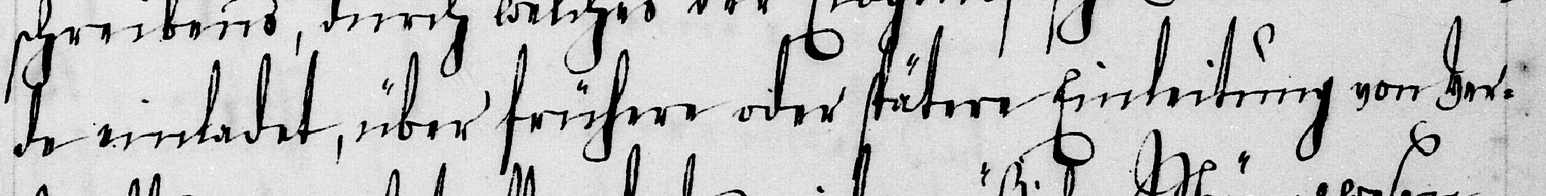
de einladet, über Prüfen oder spätere Einleitung von Ver¬
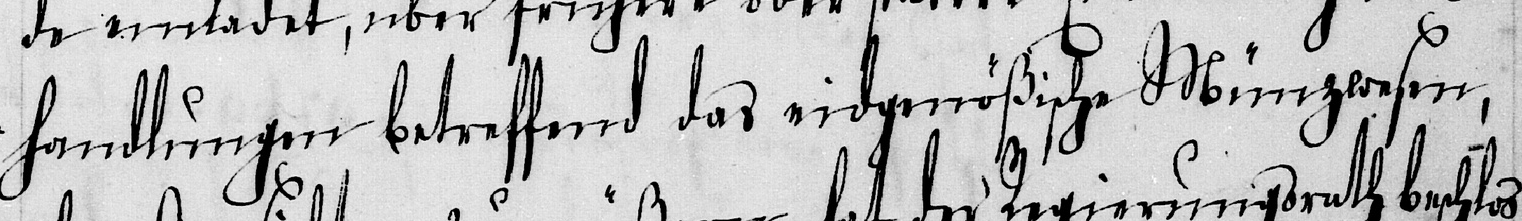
handlungen betreffend das eidgenößische Münzwesen,
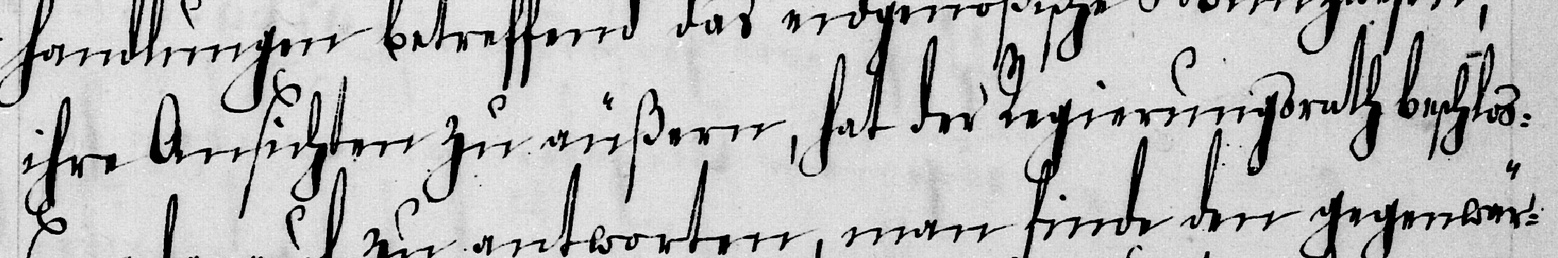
ihre Ansichten zu äußern, hat der Regierungsrath beschlo¬
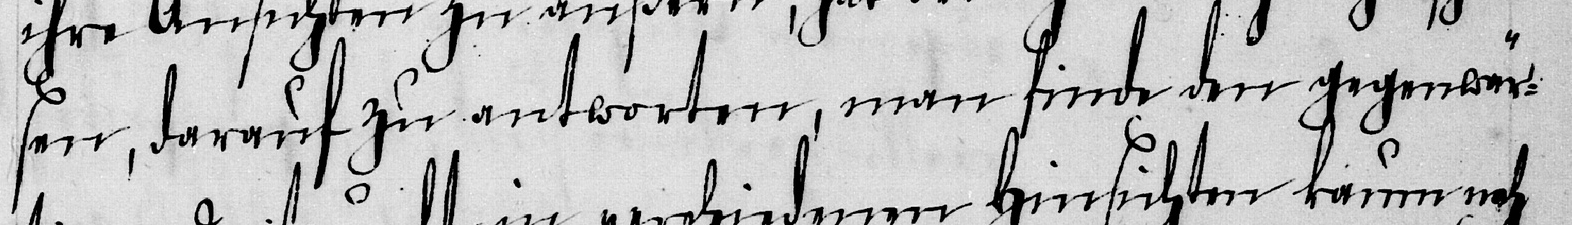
ßen, darauf zu antworten, man finde den gegenwär¬
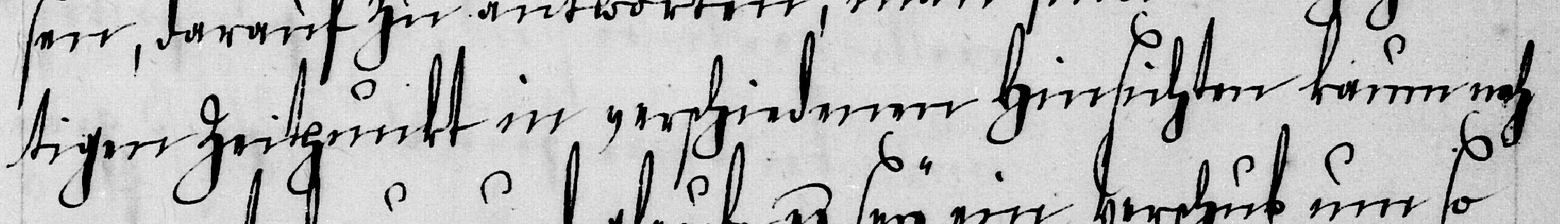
tigen Zeitpunkt in verschiedenen Hinsichten kaum noch
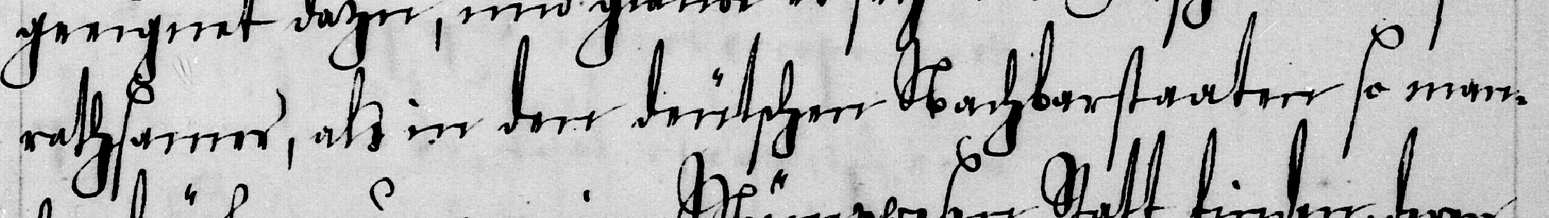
rathsamer, als in den deutschen Nachbartstaaten so man¬
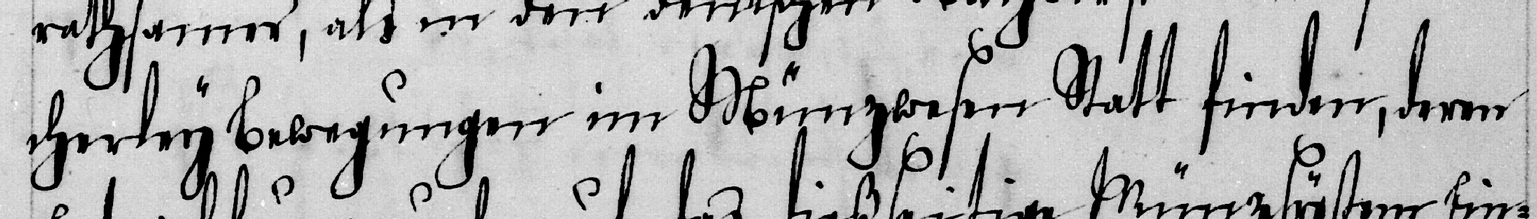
cherley Bewegungen im Münzwesen Statt finden, deren
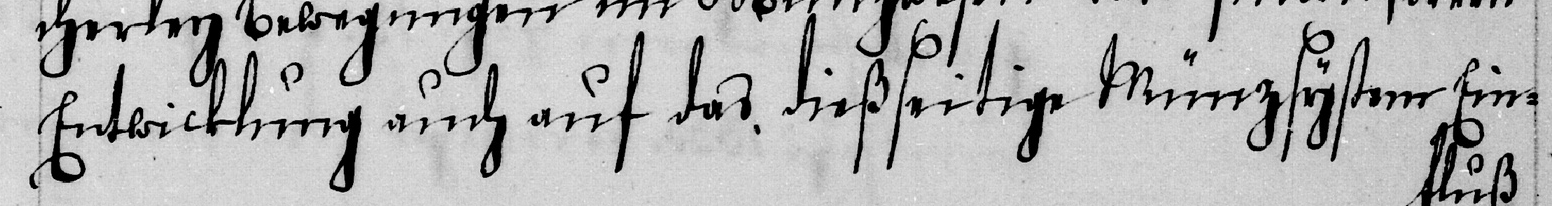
Entwicklung auch auf das dießseitige Münzsystem Ein-
